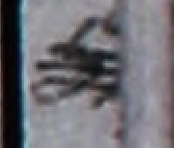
5.
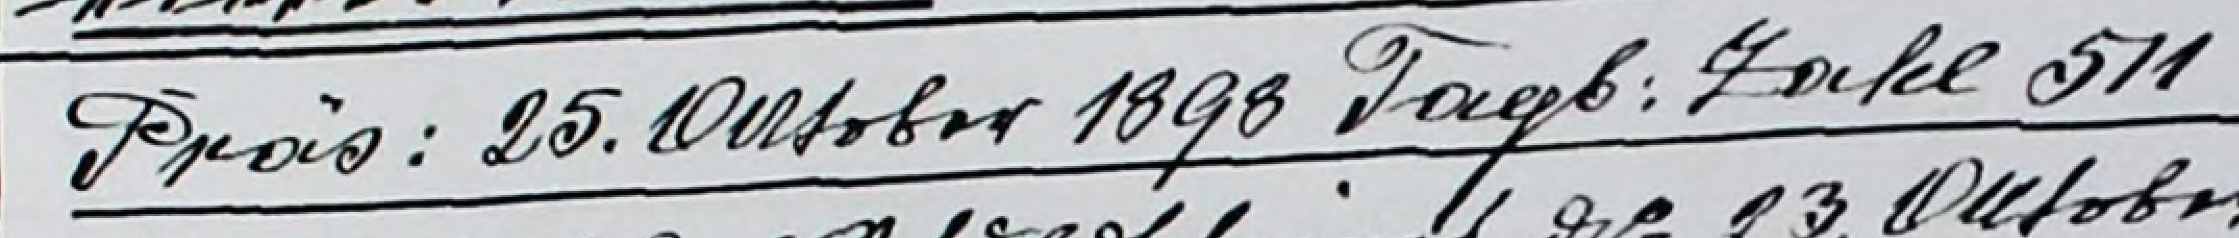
Präs: 25. Oktober 1898 Tagb: Zahl 511
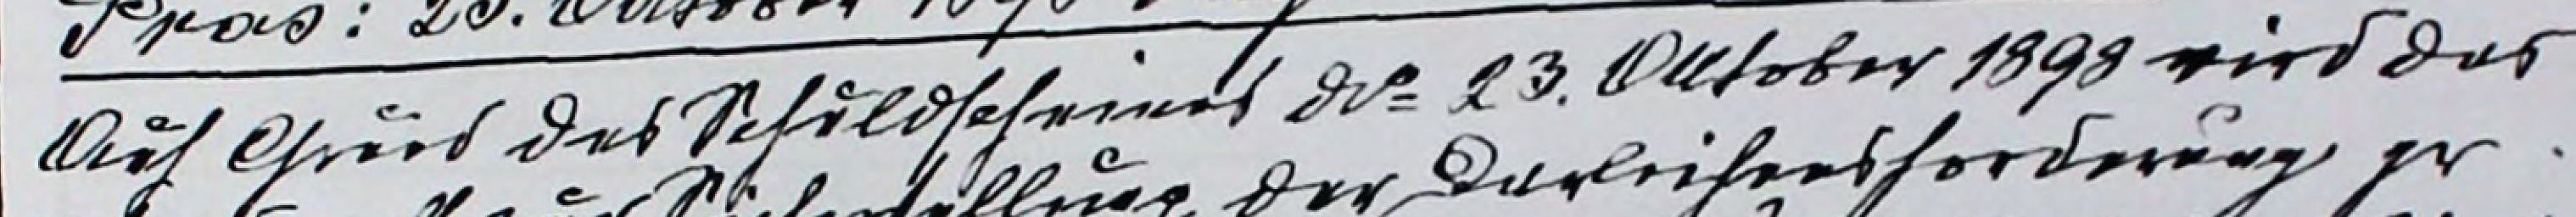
Auf Grund des Schuldscheines ddo 23. Oktober 1898 wird das
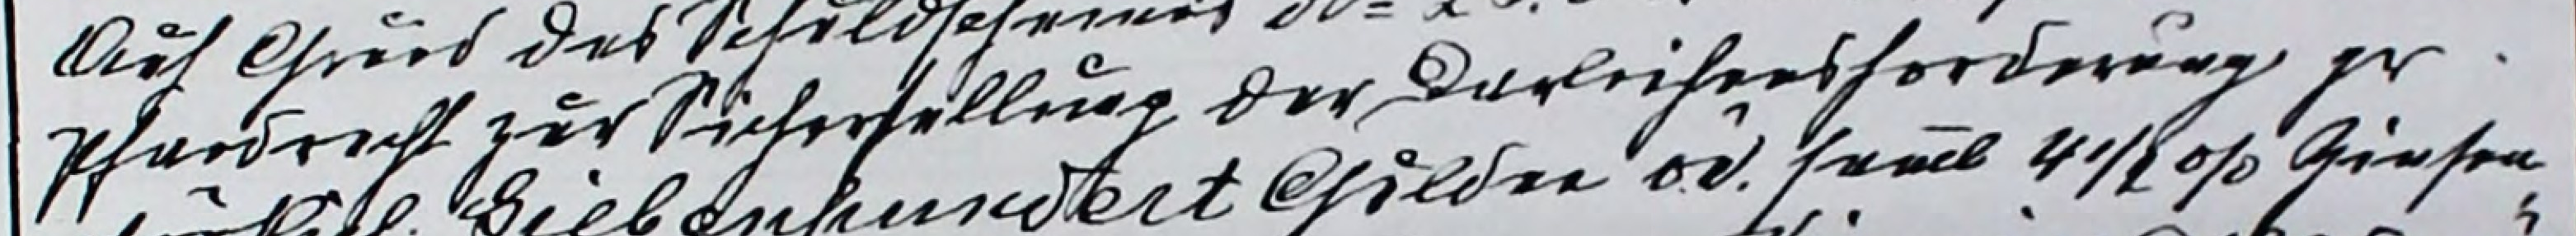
Pfandrecht zur Sicherstellung der Darleihensforderung pr
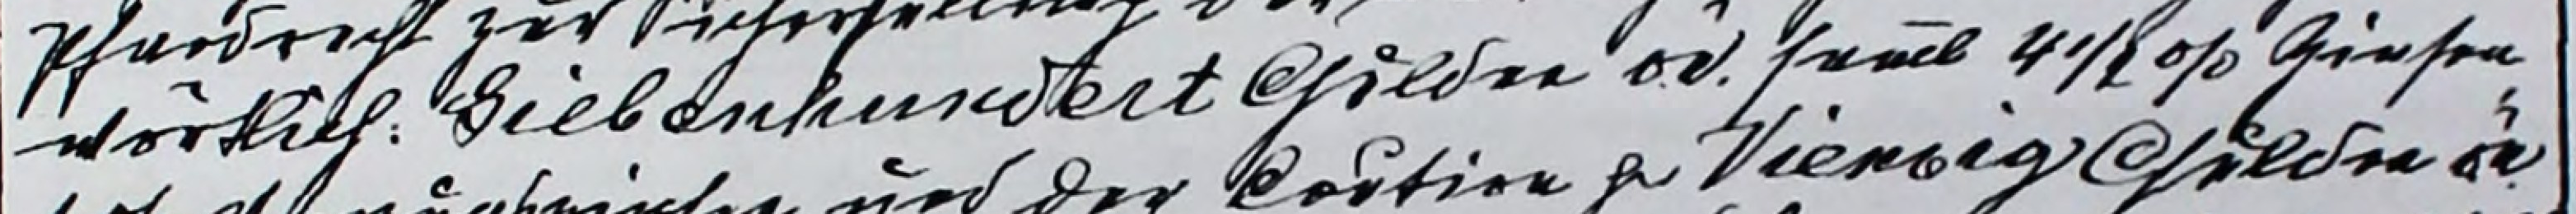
wörtlich: Siebenhundert Gulden ö.k. sammt 4 1/2 % Ginsen
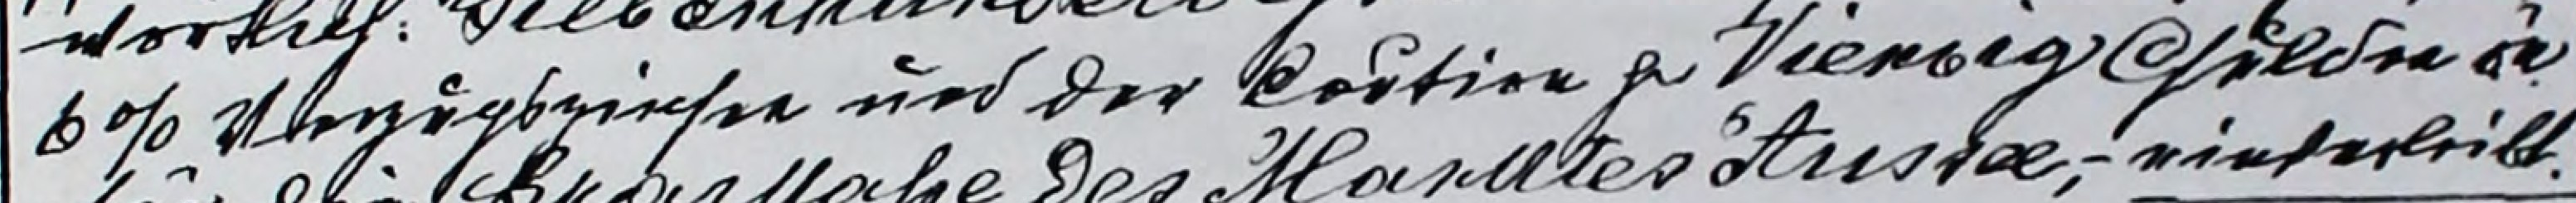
6 % Verzugszinsen und der Caution pr Vierzig Gulden ö.k.
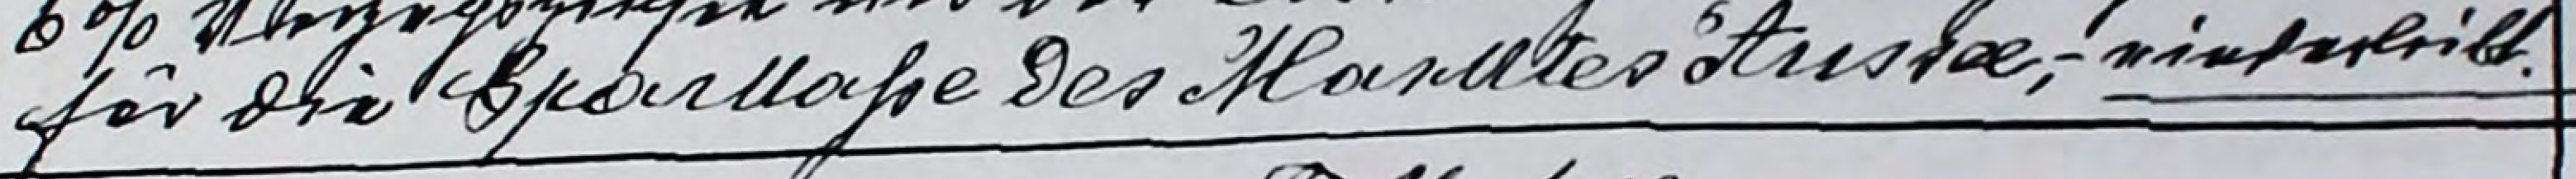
für die Sparkasse des Marktes Aussee, -einverleibt.
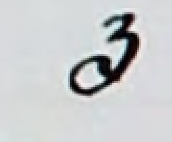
3
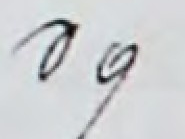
s 9
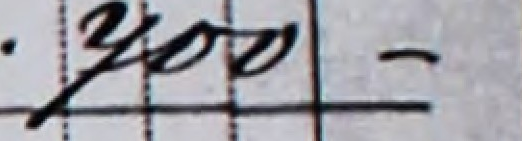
700 -
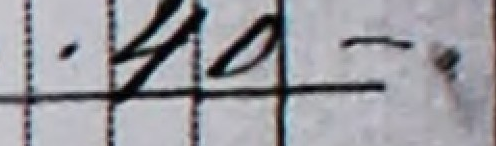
40 -
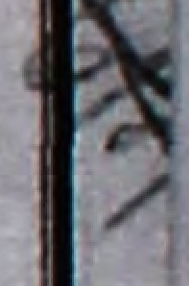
6??
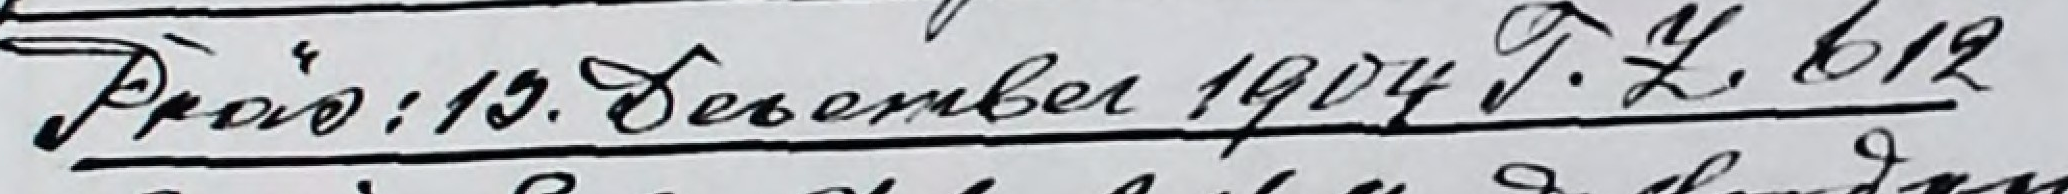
Präs: 13. Dezember 1904 T.Z.612
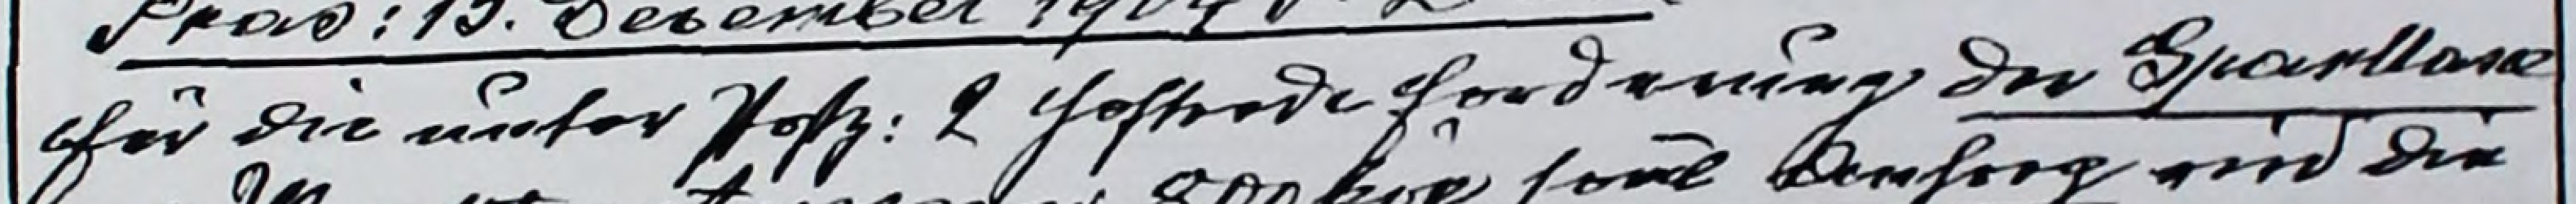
Für die unter Postz: 2 Haftendeforderung der Sparkasse
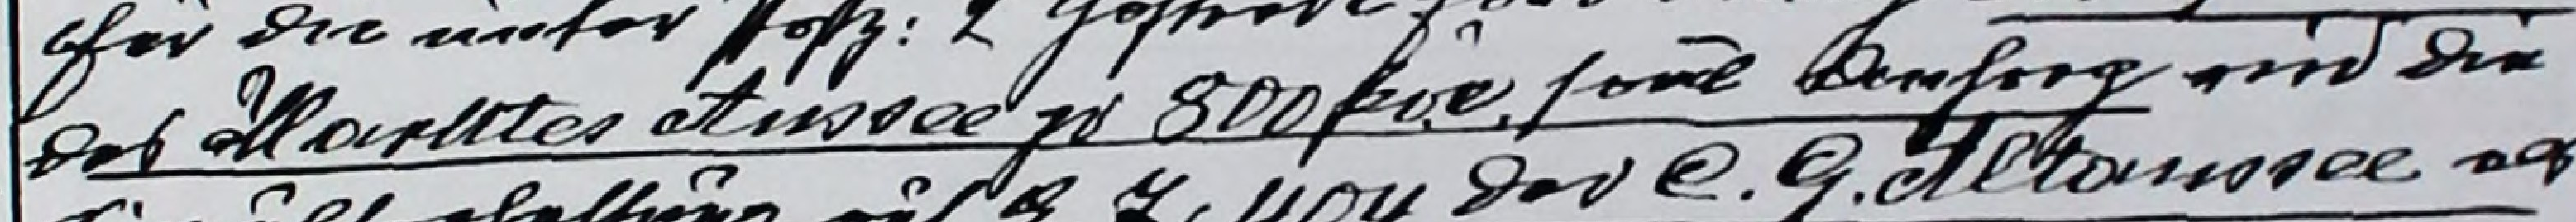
des Marktes Aussee pr 800 f ö.k. sammt Anhang wird die
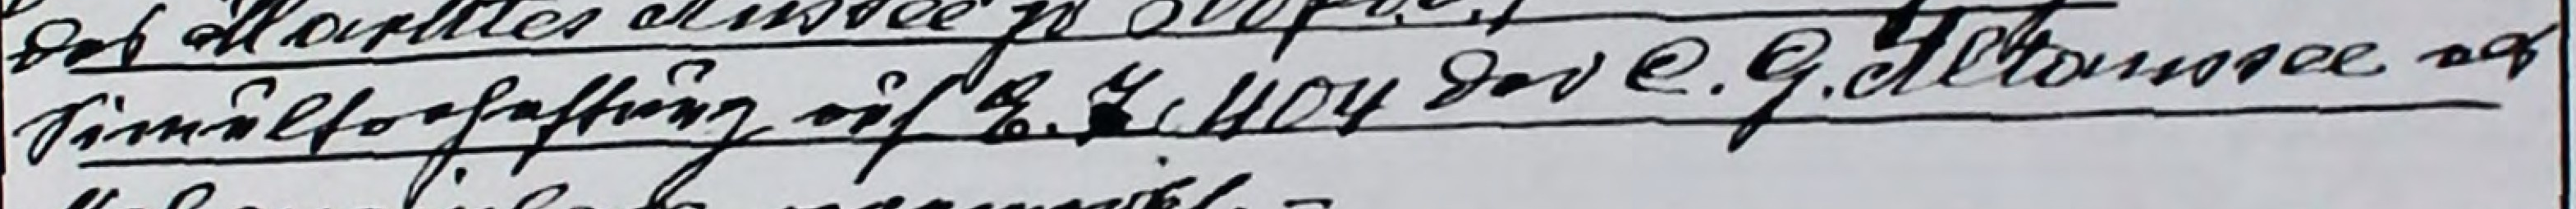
Simultanhaftung auf E.Z. 404 der C.G. Altaussee als
